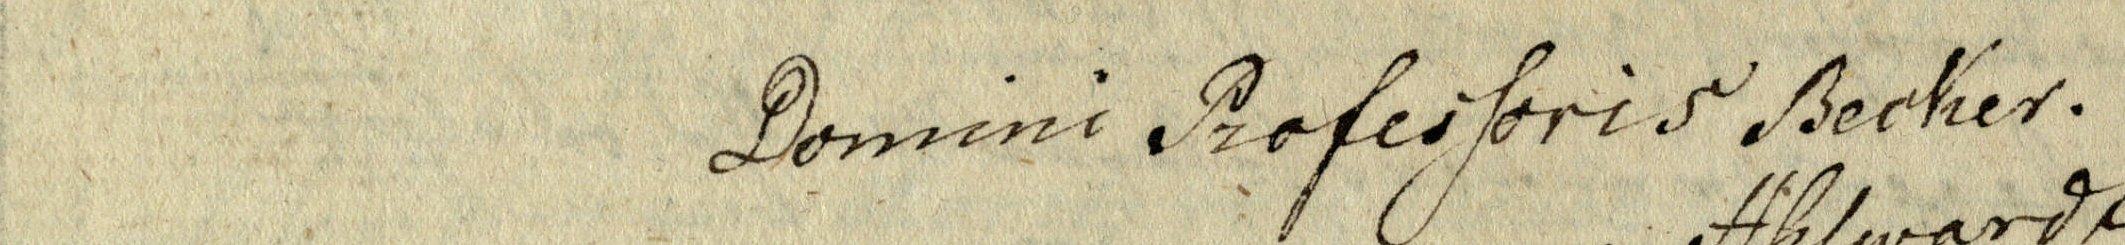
Domini Professoris Becker.
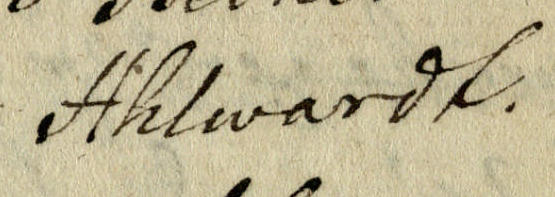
Ahlwardt.
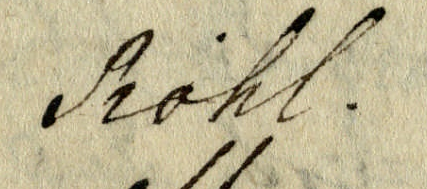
Röhl.
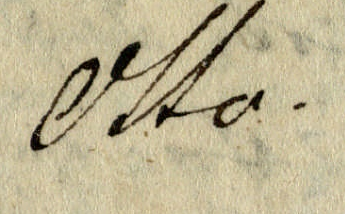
Otto.
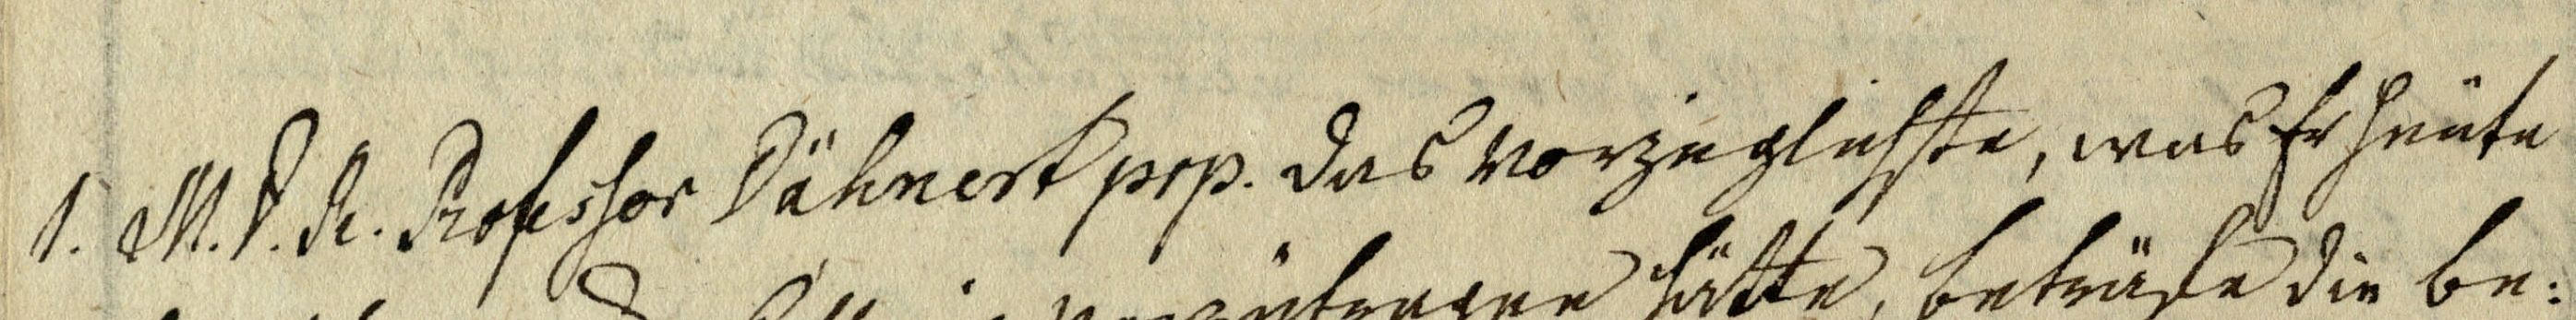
1. M. D. R. Professor Dähnert prp. das vorzüglichste, was Er heute
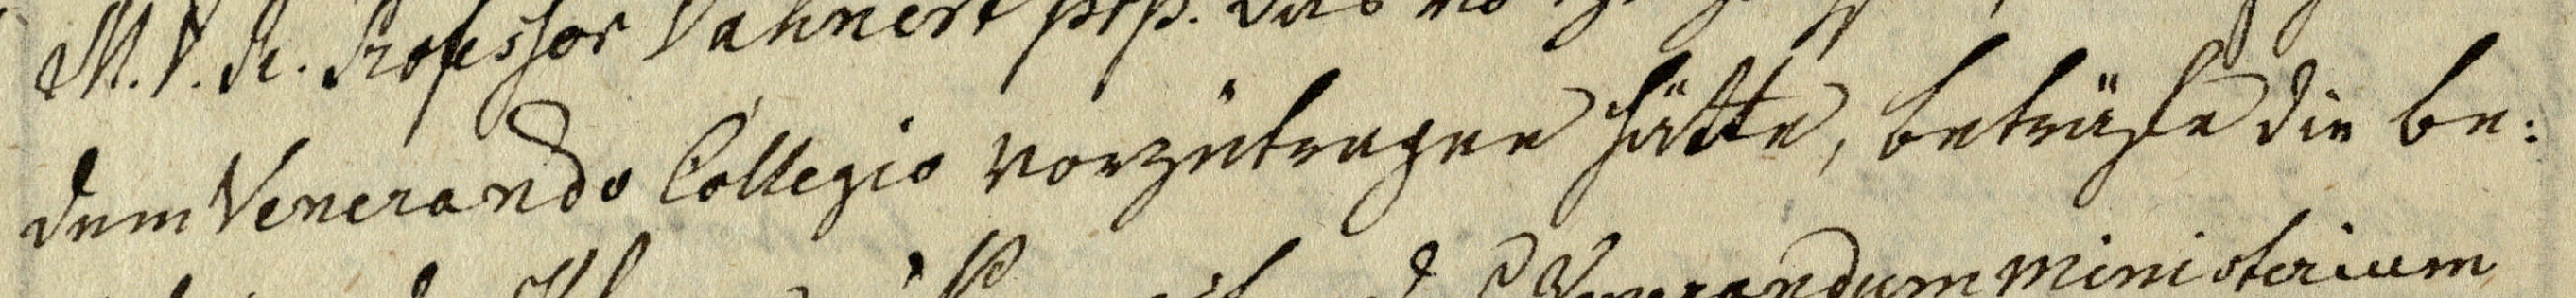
dem Venerando Collegio vorzutragen hätte, beträfe die be¬
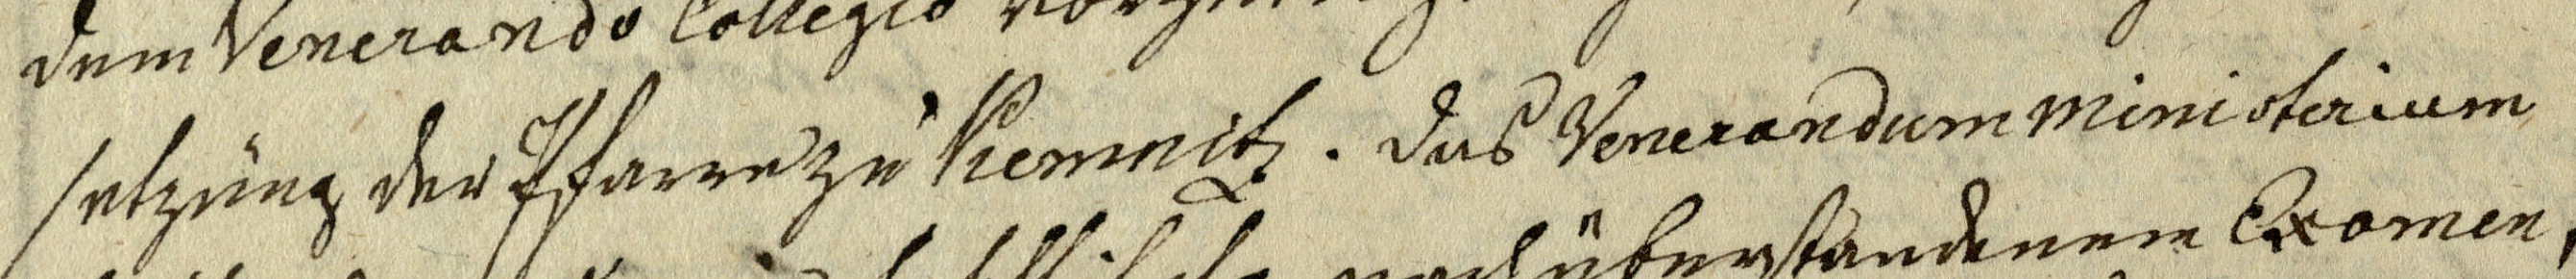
setzung der Pfarre zu Kemnitz. das Venerandum Ministerium
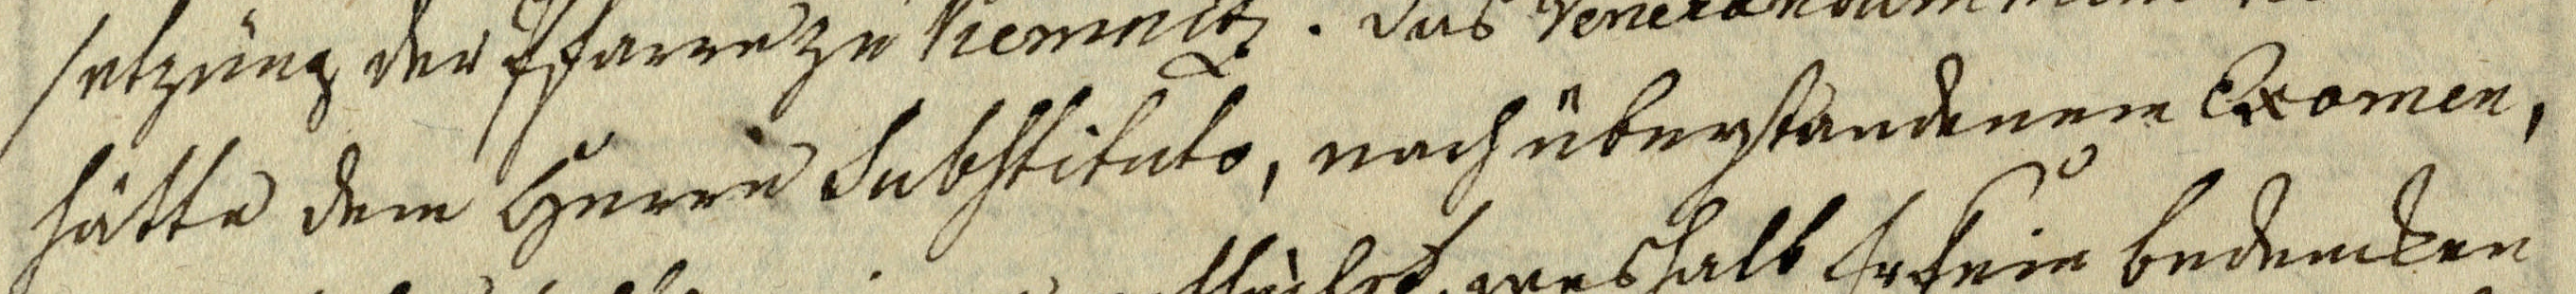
hätte dem Herrn Substituto, nach überstandenem Examen,
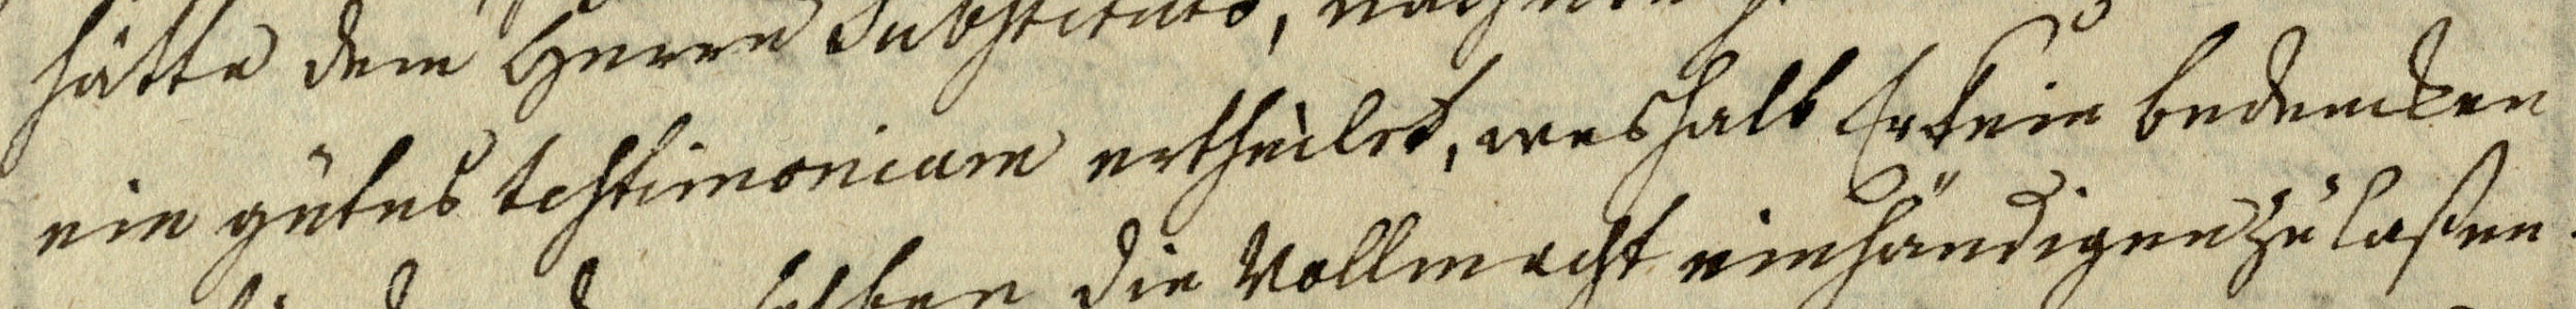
ein gutes testimonium ertheilet, weshalb Er kein Bedencken
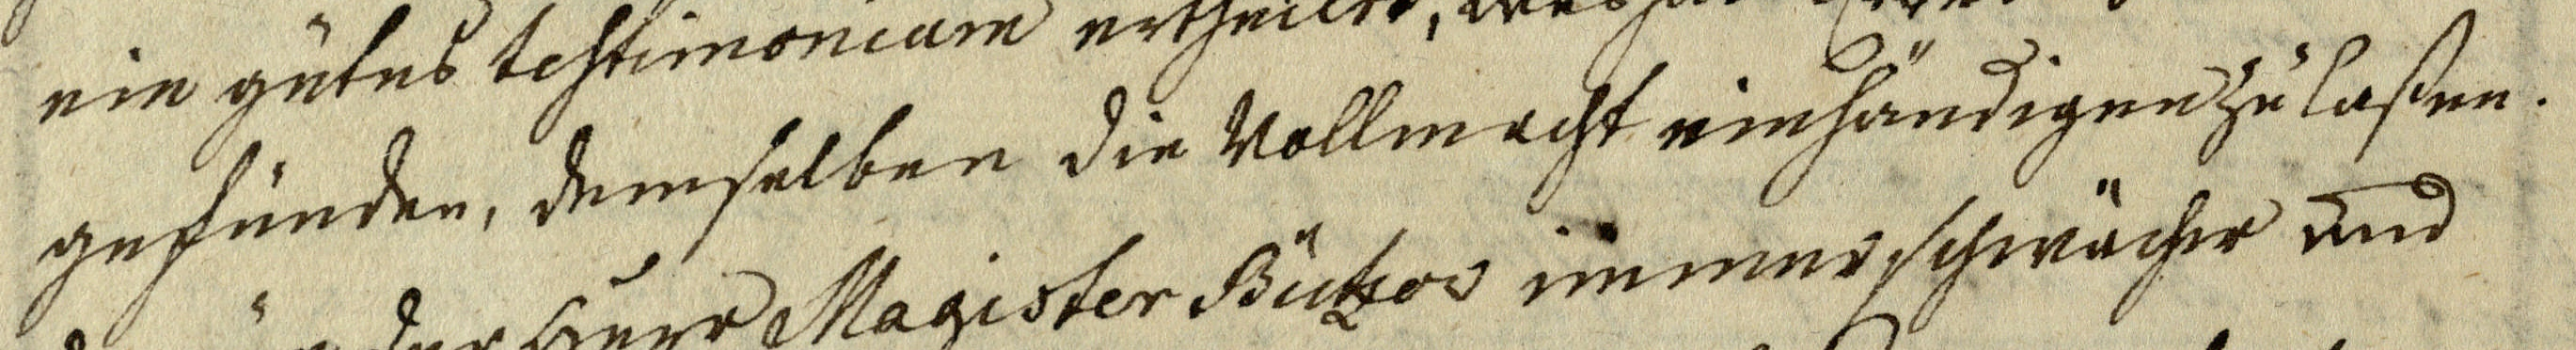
gefunden, demselben die Vollmacht einhändigen zu laßen.
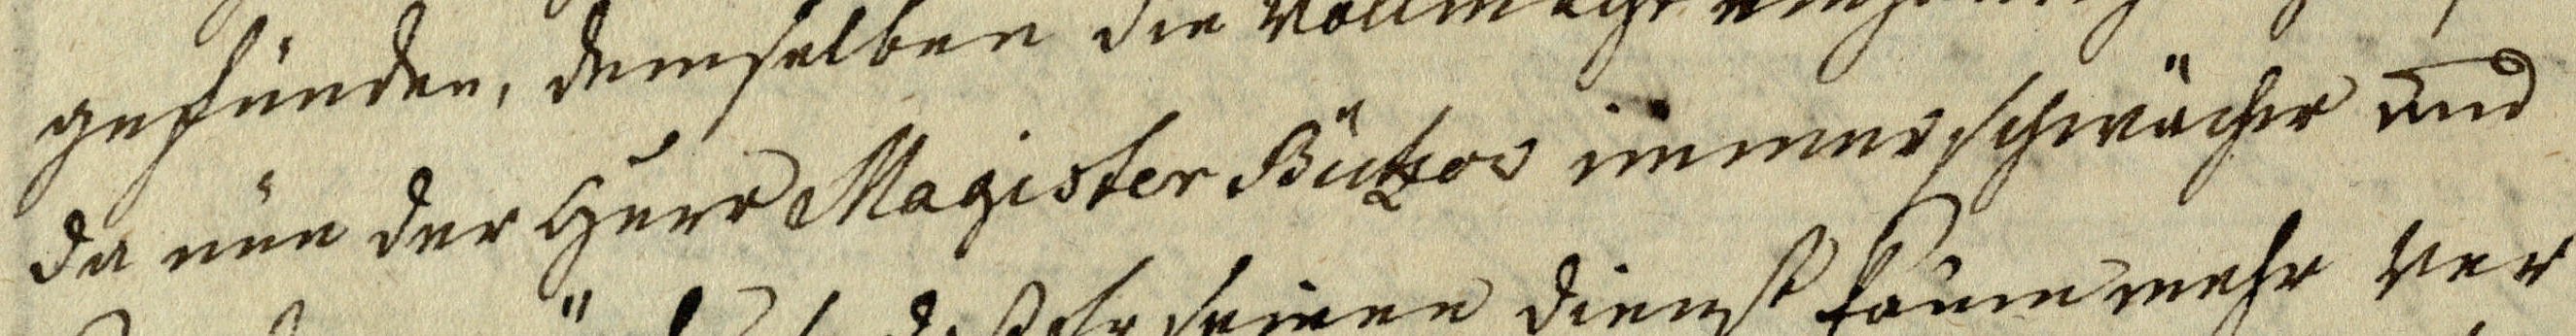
da nun der Herr Magister Bützow immer schwächer und
